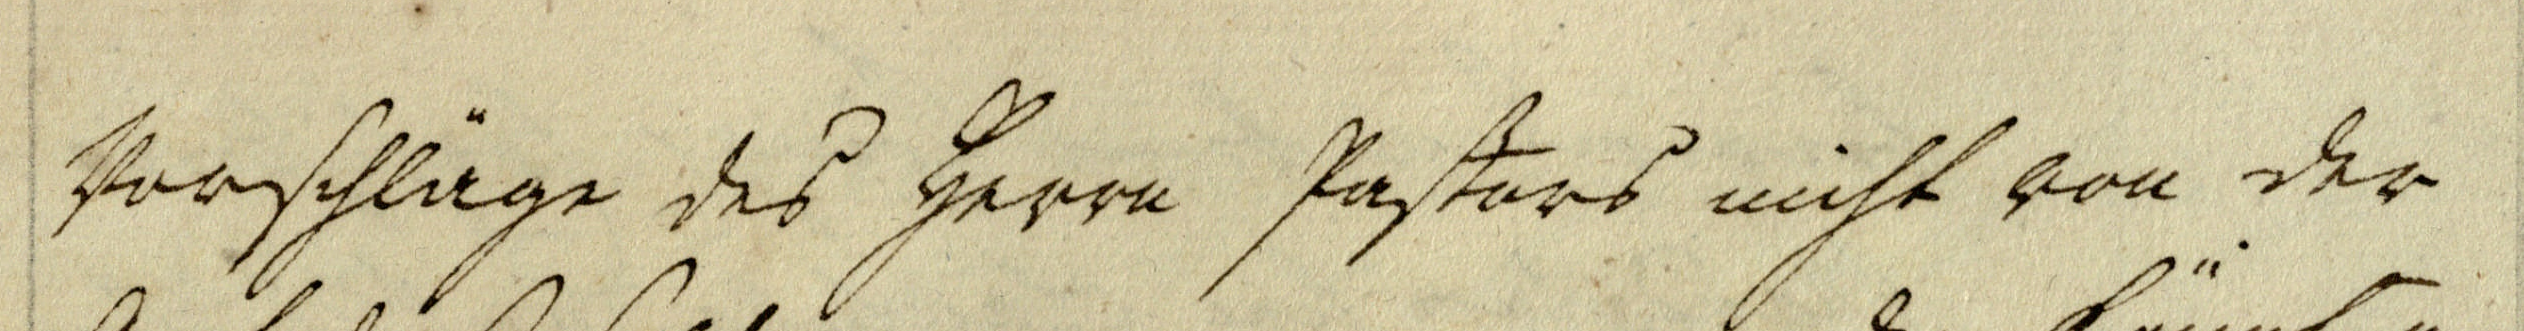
Vorschläge des Herrn Pastors nicht von der
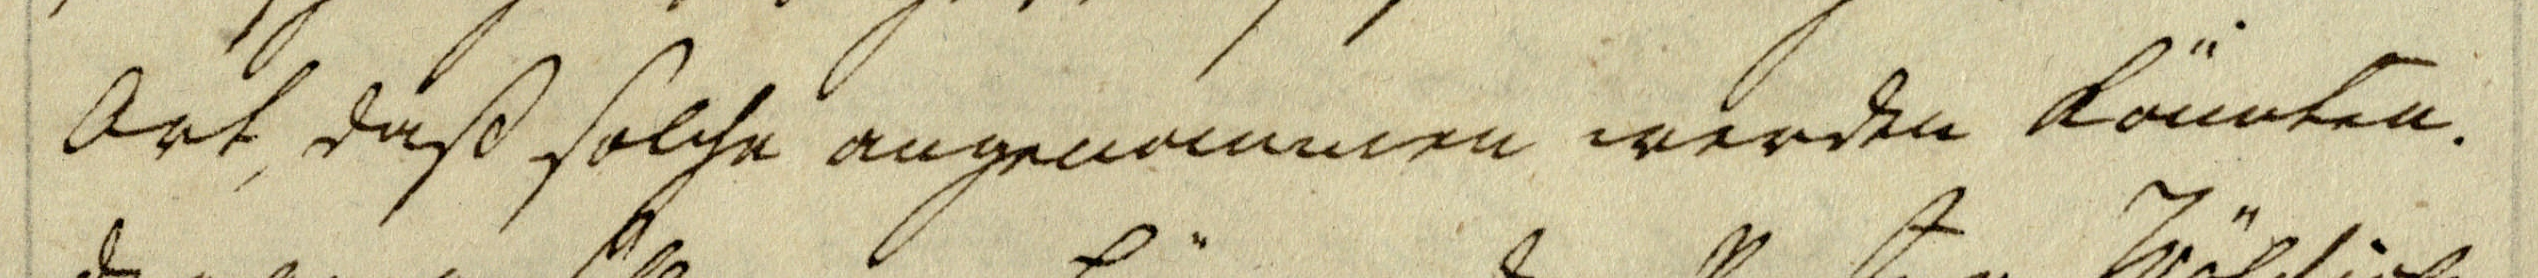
Art, daß solche angenommen werden könnten.
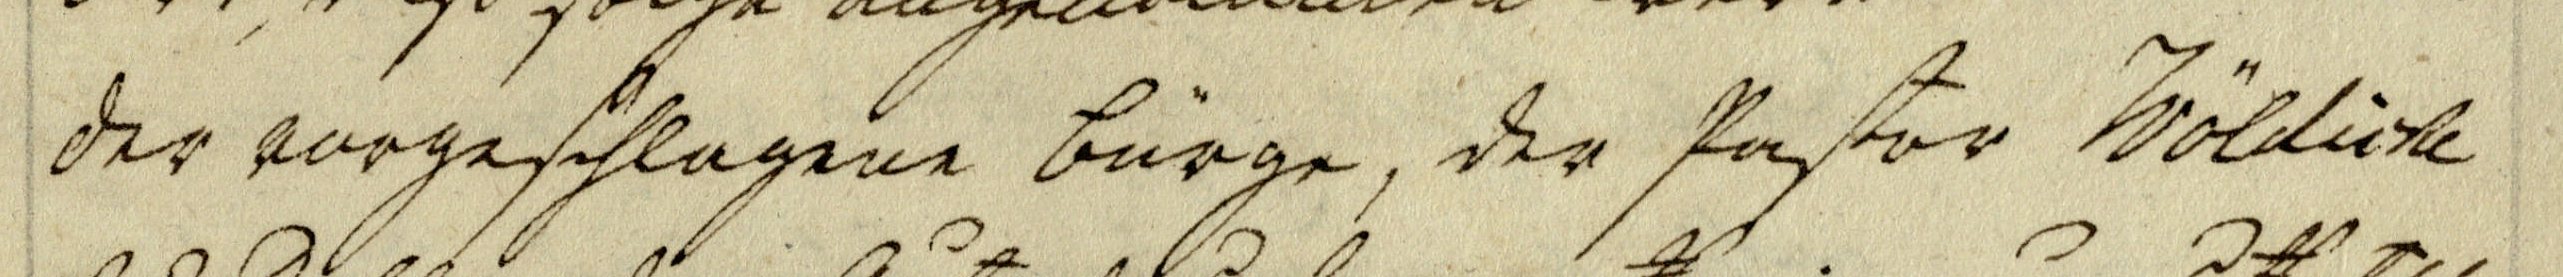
Der vorgeschlagene Bürge, der Pastor Wöldicke
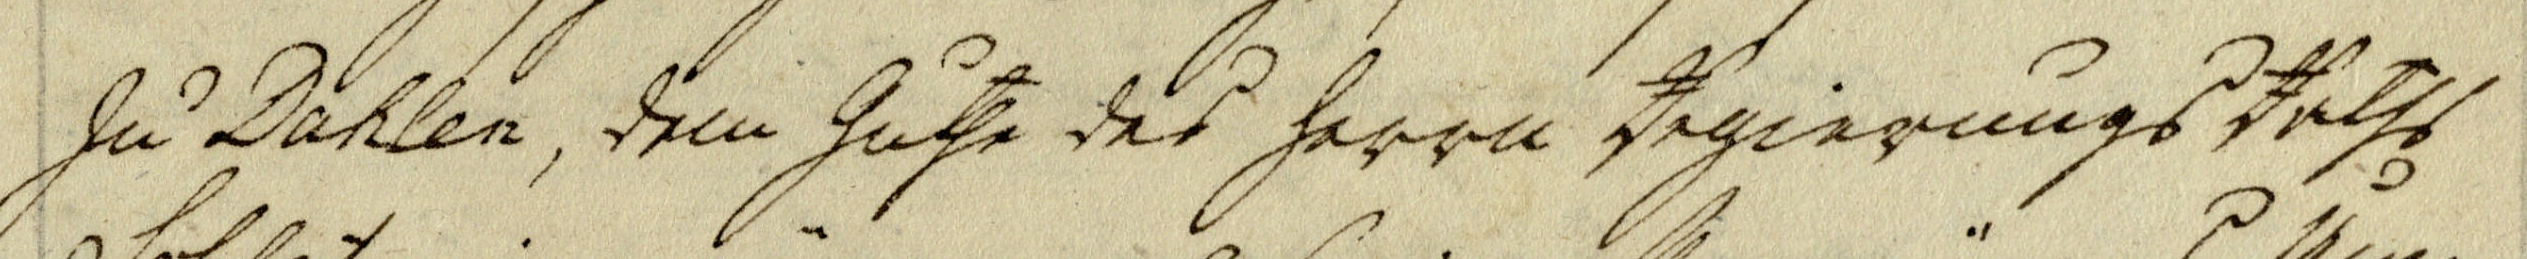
zu Dahlen, dem Guthe des Herrn Regierungs Raths
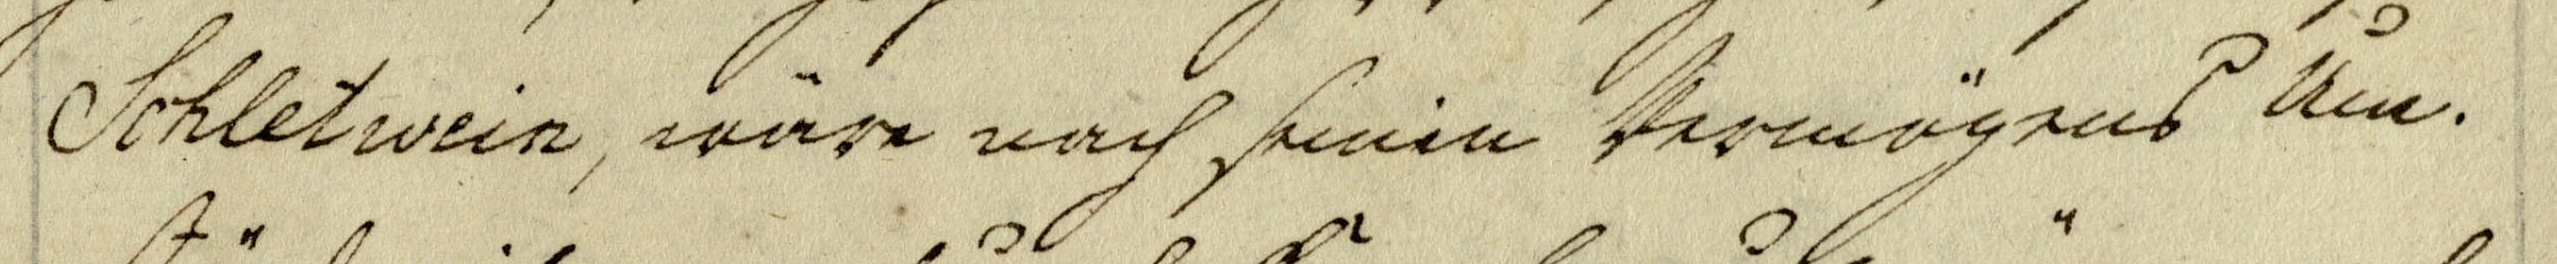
Schletwein, wäre nach seinen Vermögens Um¬
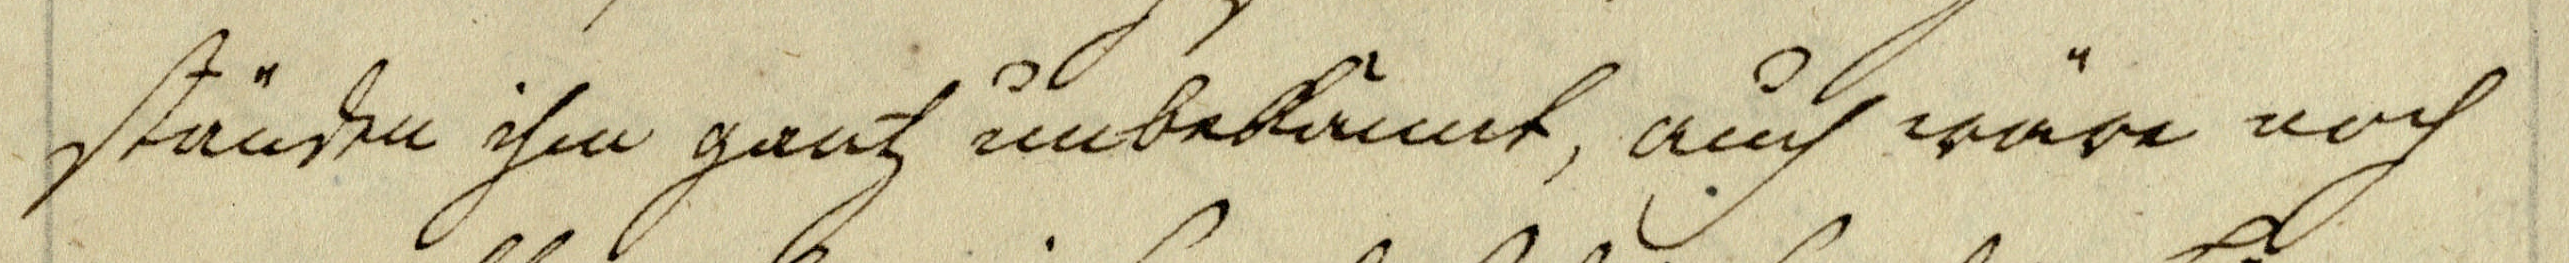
ständen ihm gantz unbekannt, auch wäre noch
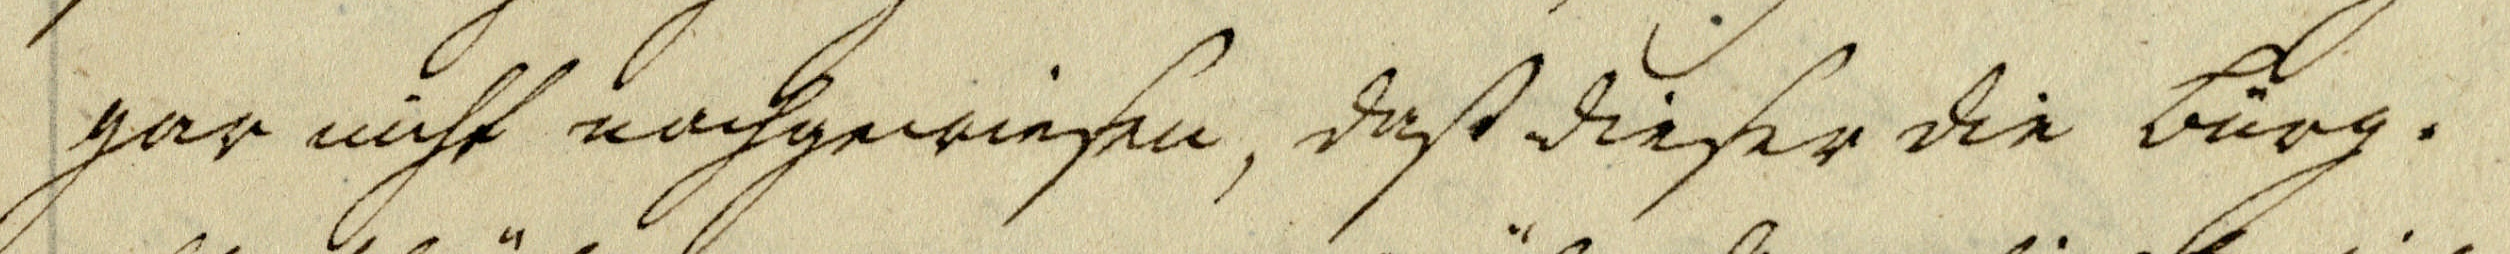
gar nicht nachgewiesen, daß dieser die Bürg¬
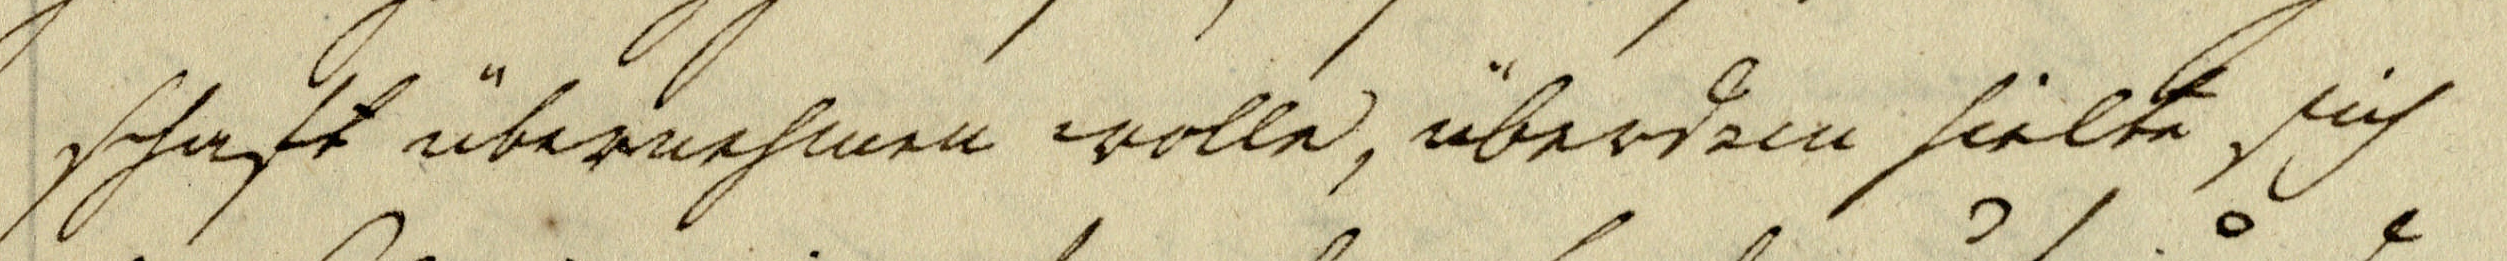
schaft übernehmen wolle, überdem hielte sich
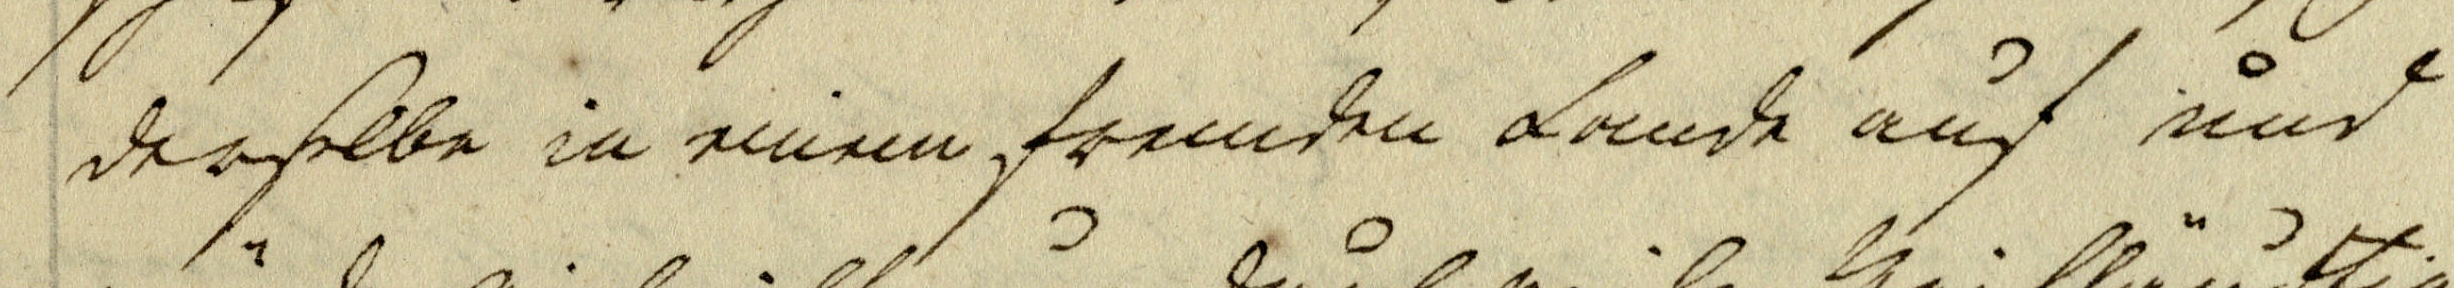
derselbe in einem fremden Lande auf und
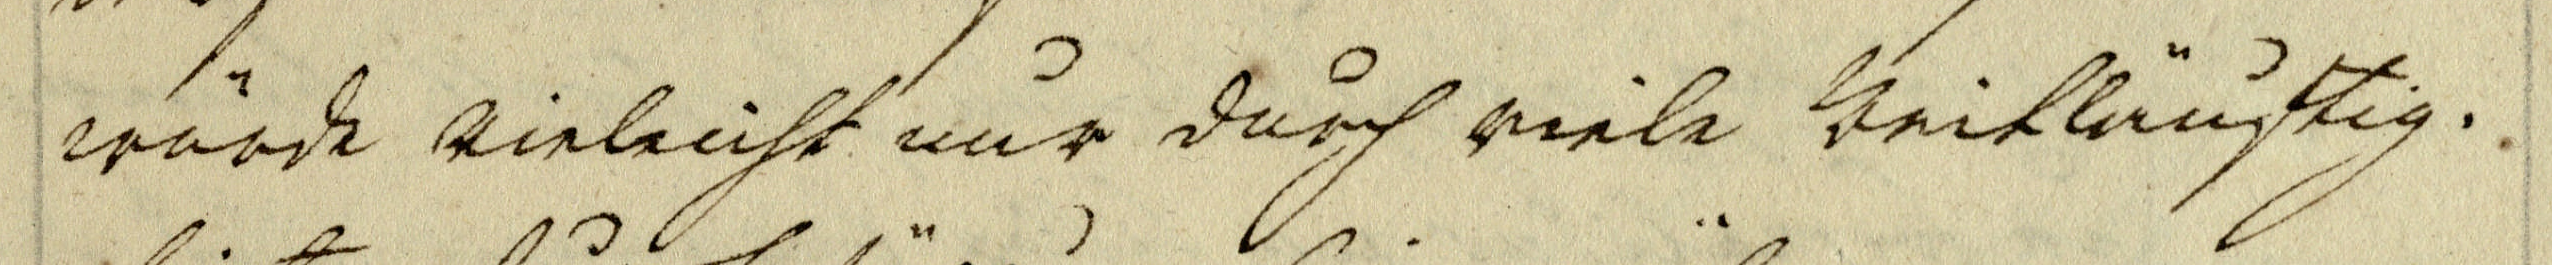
würde vieleicht nur durch viele Weitläuftig¬
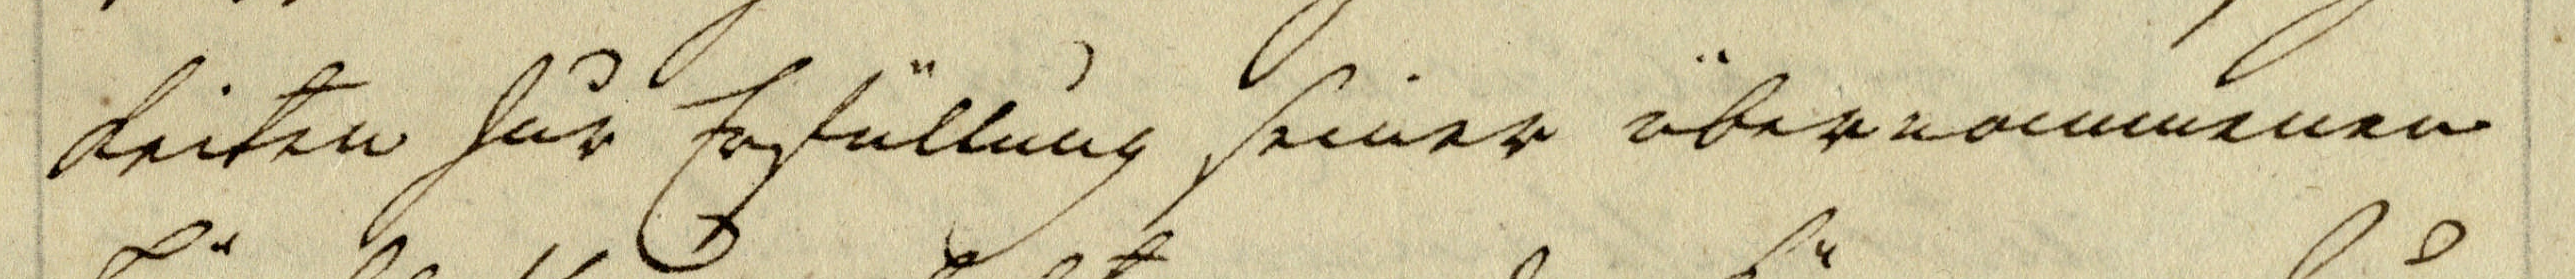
keiten zur Erfüllung seiner übernommenen
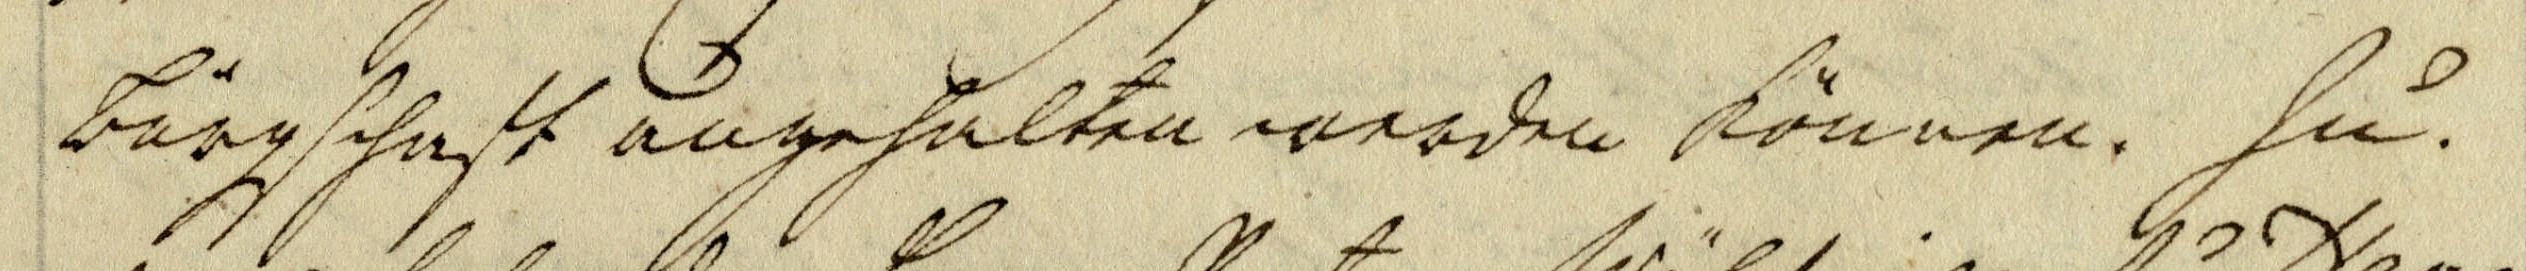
Bürgschaft angehalten werden können. Zu¬
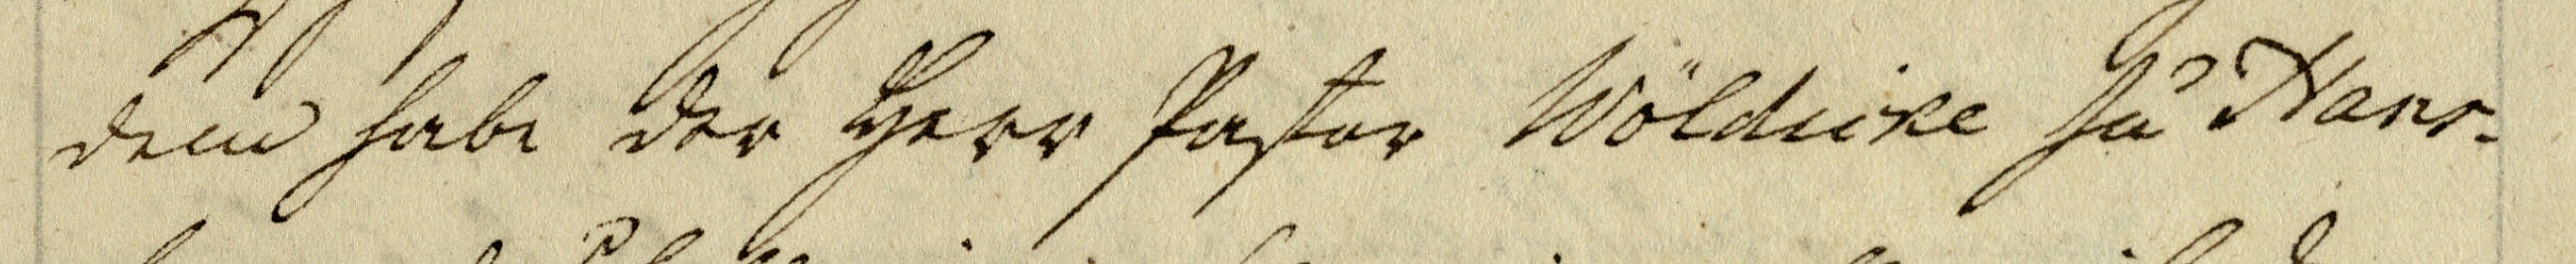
dem habe der Herr Pastor Wöldicke zu Hans¬
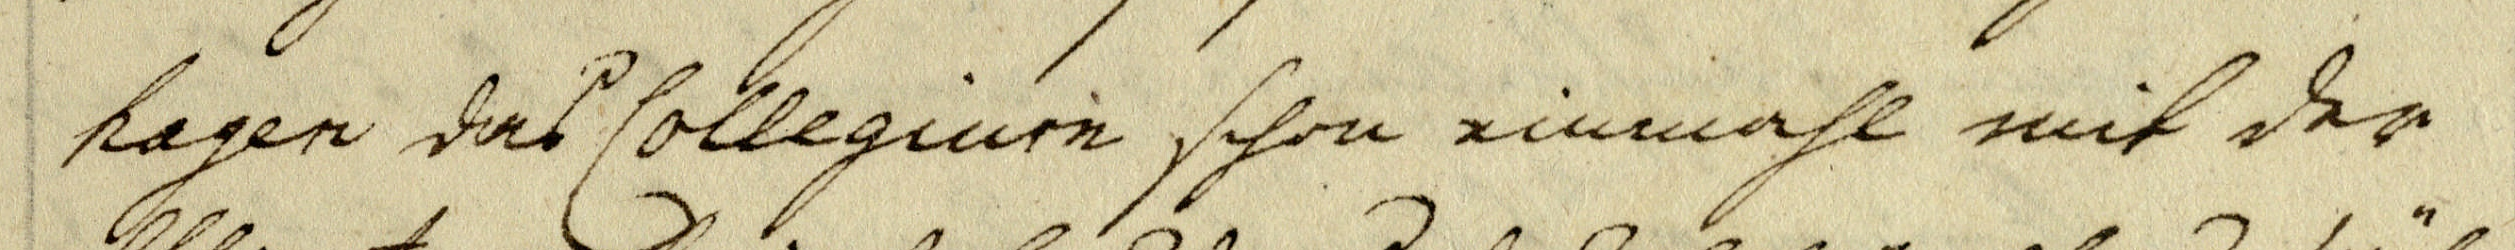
hagen das Collegium schon einmahl mit der
